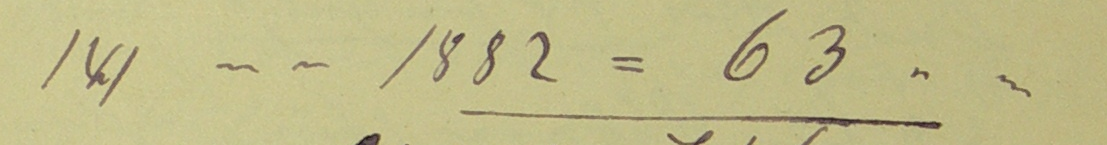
14) * 1882 = 63
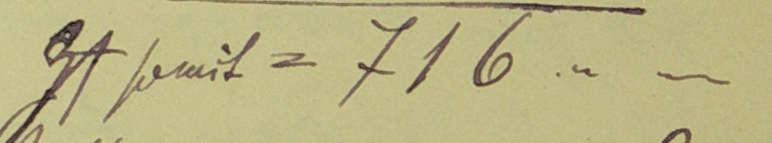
Somit Gesamt = 716
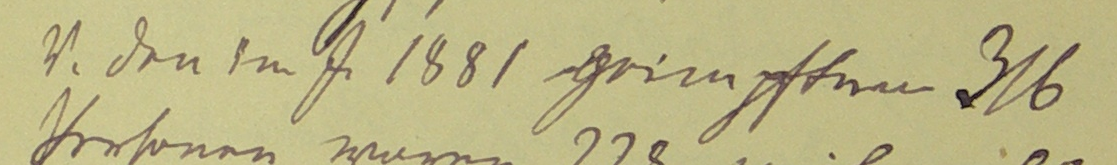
Von den im J. 1881 geimpften 316
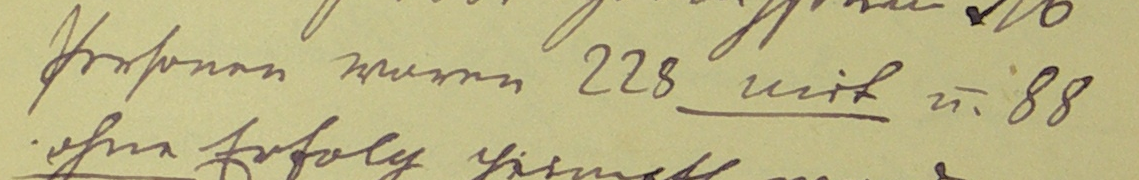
Personen waren 225 mit, und 88
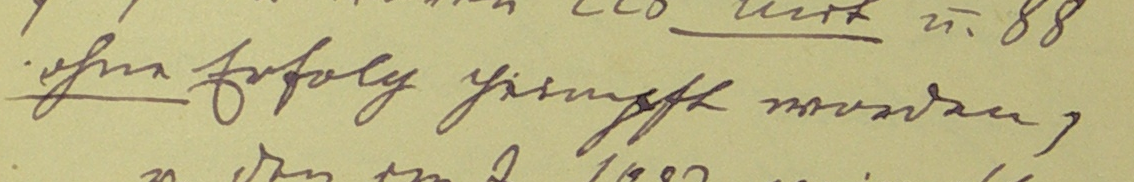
ohne Erfolg geimpft worden,
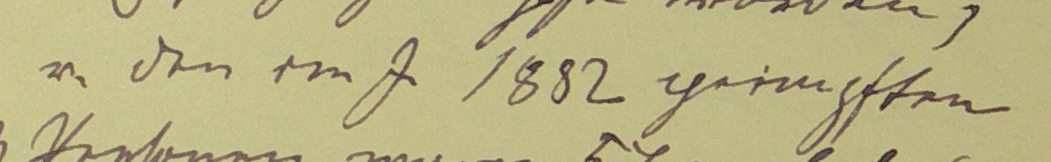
von den 1882 geimpften
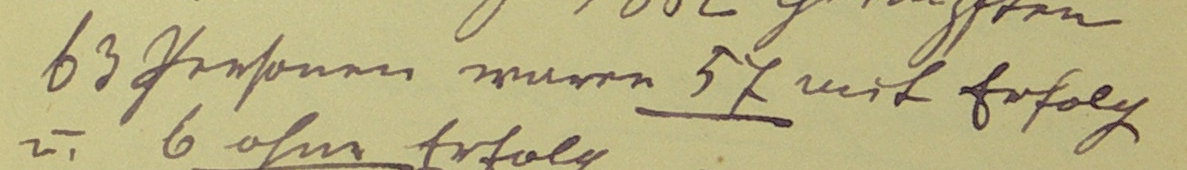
63 Personen waren 57 mit Erfolg
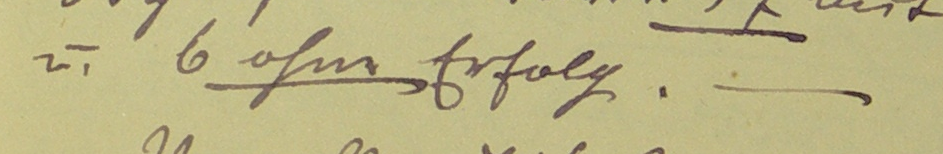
und 6 ohne Erfolg.—
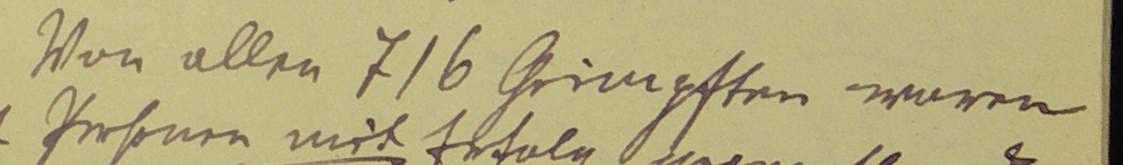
Von allen 716 Geimpften waren
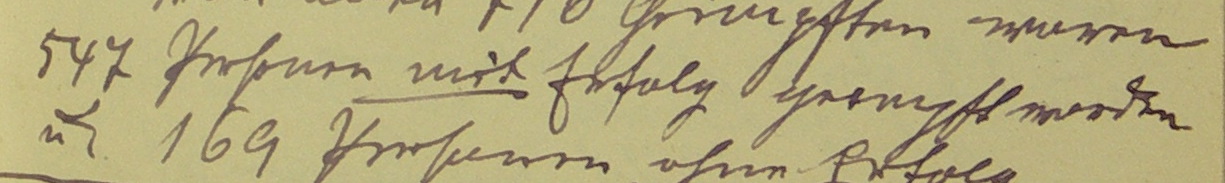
547 Personen mit Erfolg geimpft worden
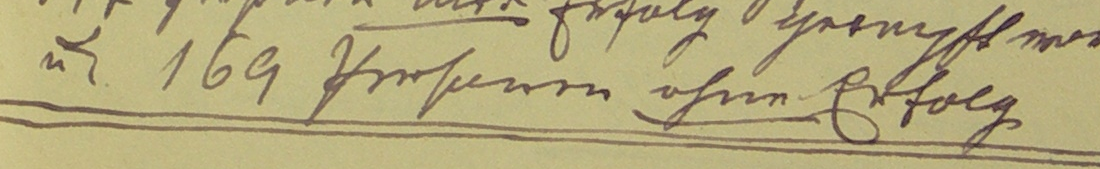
und 169 Personen ohne Erfolg.
